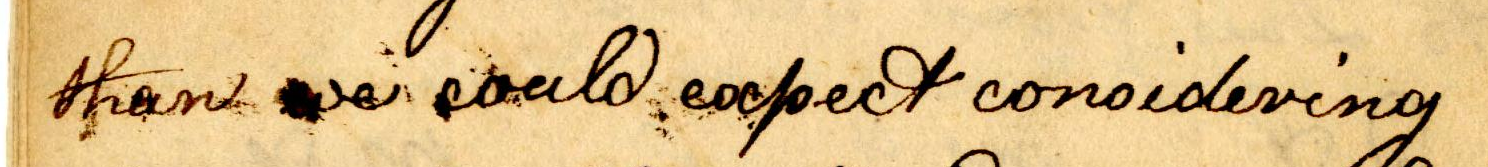than we could expect considering
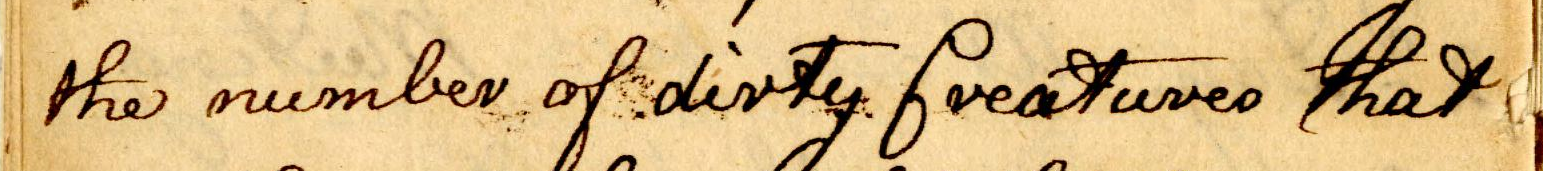the number of dirty Creatures that
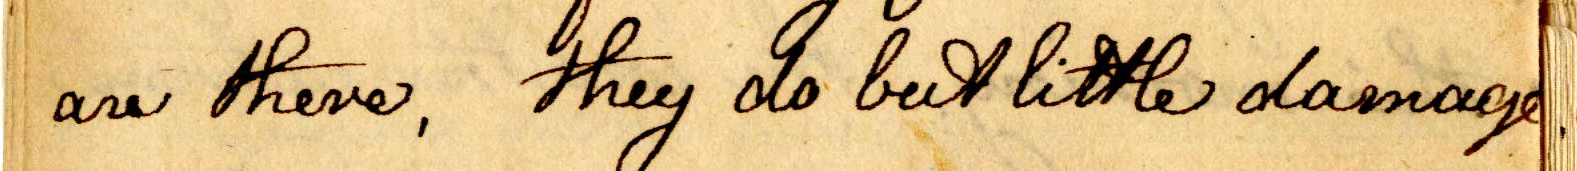are there, they do but little damage
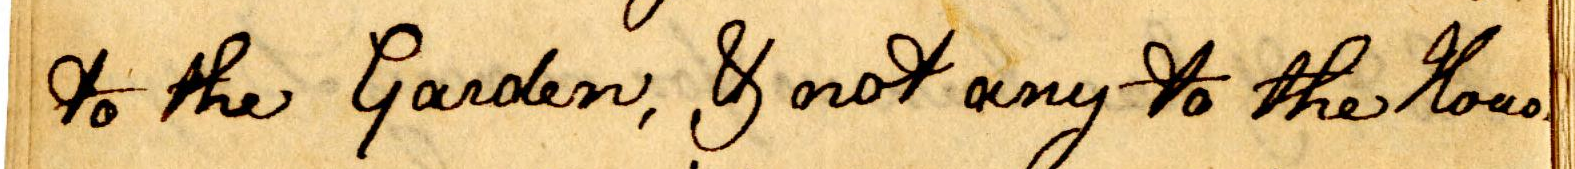to the Garden, & not any to the Hous
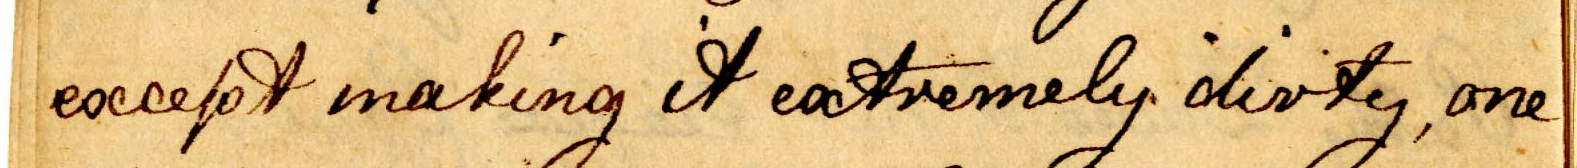except making it extremely dirty, one
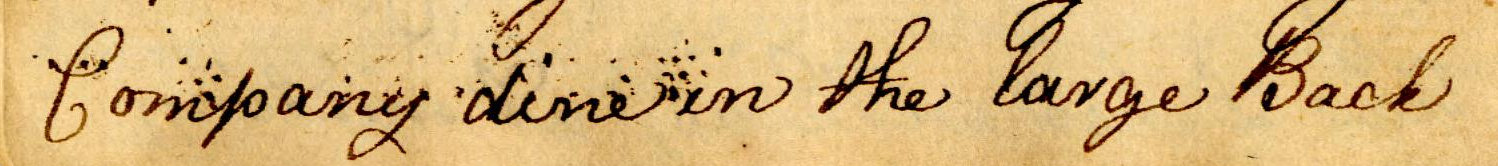Company dine in the large Back
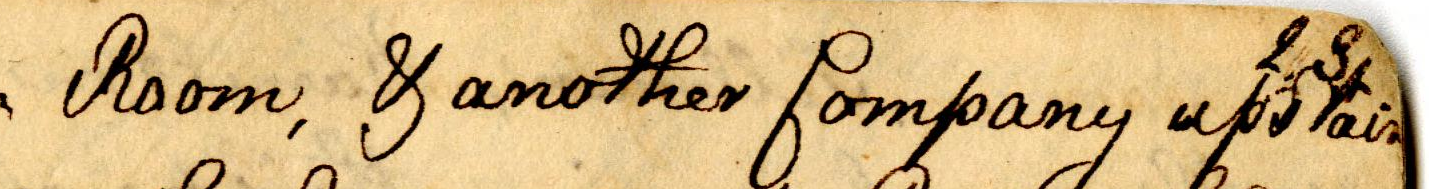Room, & another Company upstairs
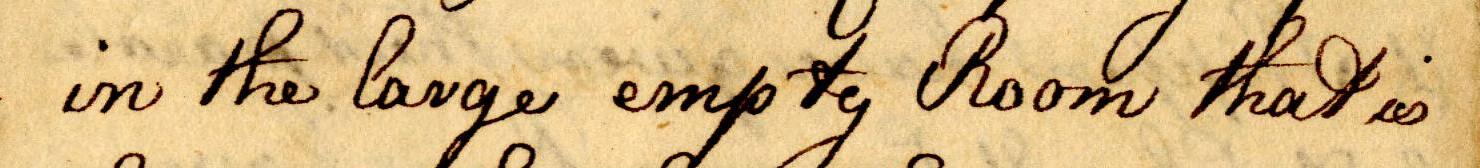in the large empty Room that is
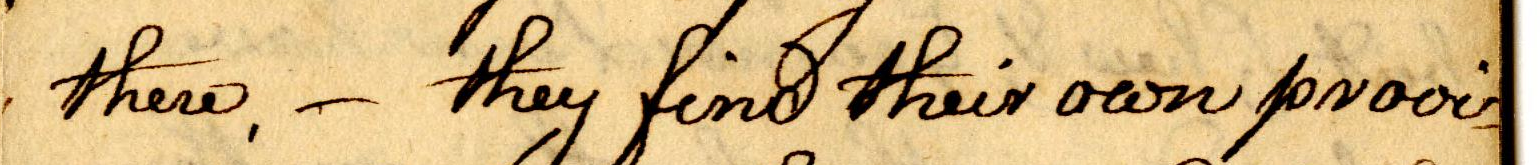there,- they find their own provis
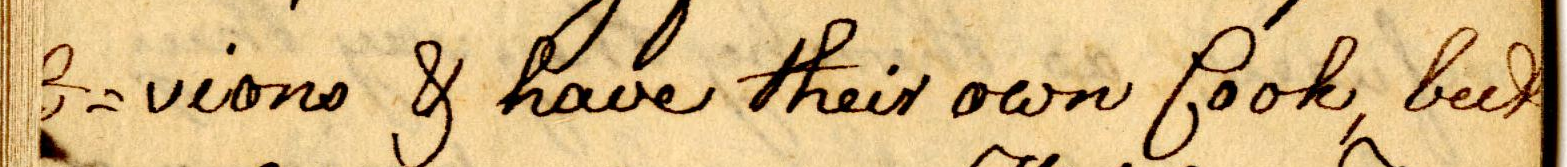-vions & have their own Cook, but
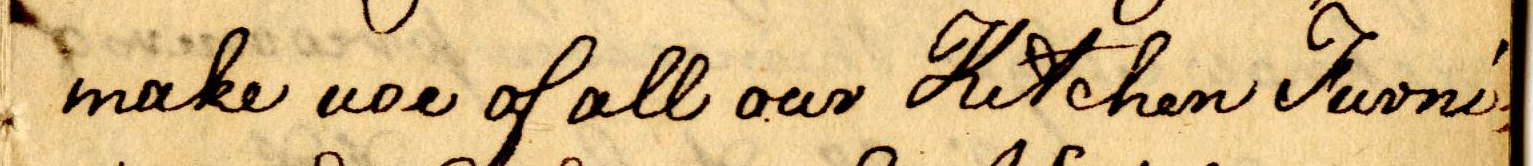make use of all our Kitchen Furni-
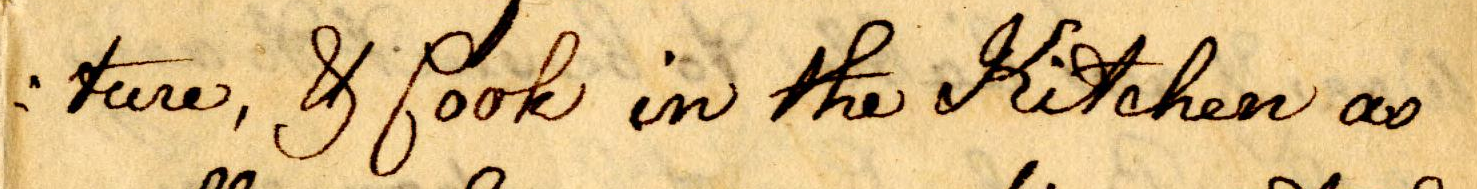-ture, & Cook in the Kitchen as
